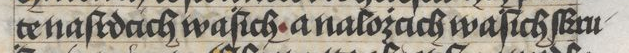te naſrdcich waẛich.a na lożcich waẛich ſkru¬
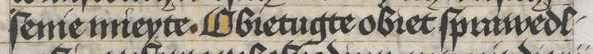ẛene mieyte.Obietugte obiet ſprawedl¬
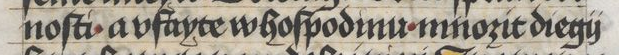noſti.a ufayte w hoſpodinu.mnozit diegij
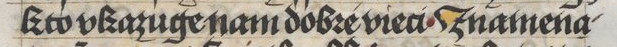kto ukazuge nam dobre vieci.Znamena¬
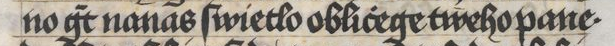no ḡt nanas ſwietlo obliċege tweho pane.
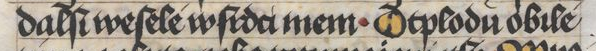dalſi weselé wsrdci mem.Otplodu obilé
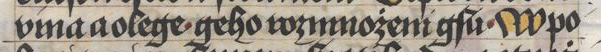vína a olege.geho rozmnożeni gſu.Wpo¬
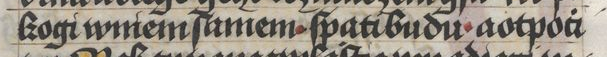kogi w niem ſamem.ſpati budu.a otpoċi¬
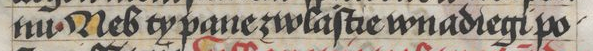nu.Neb ty pane zwlaẛtie wnadiegi po¬
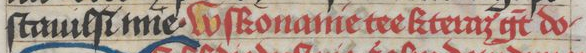ſtavilſi mie.Wſkonanie tee kteraž ḡt do¬
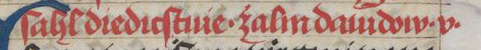ſahl diedicſtwie.žalm davidow.v.
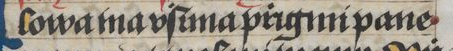lowa ma uẛima pṙigmi pane.
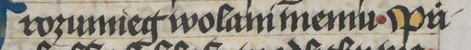rozumieg wolani memu.Pṙi¬
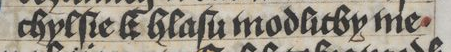chylſie k hlaſu modlitby me.
